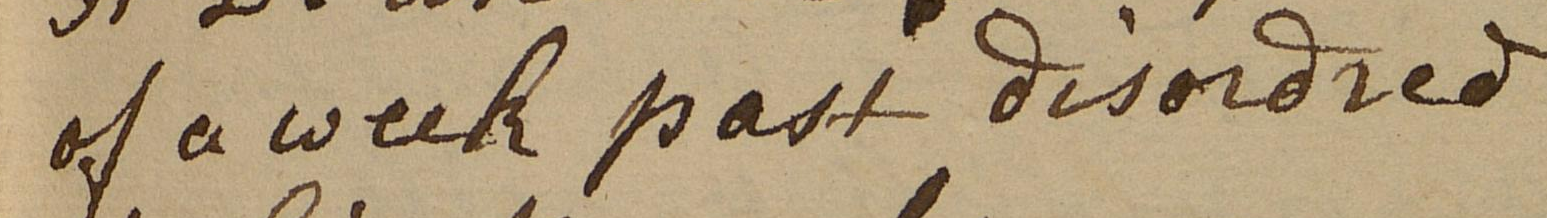of a week past disordred
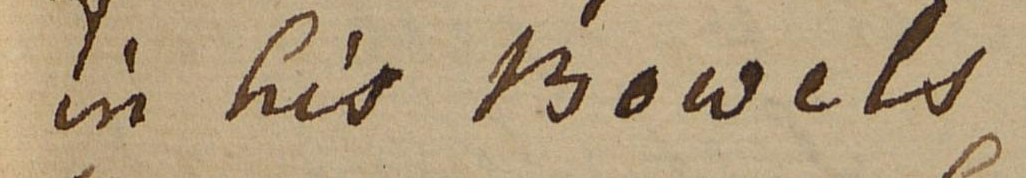in his Bowels-
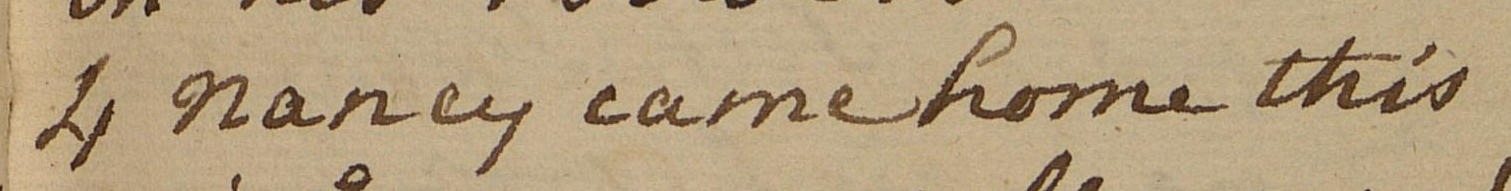4 Nancy came home this
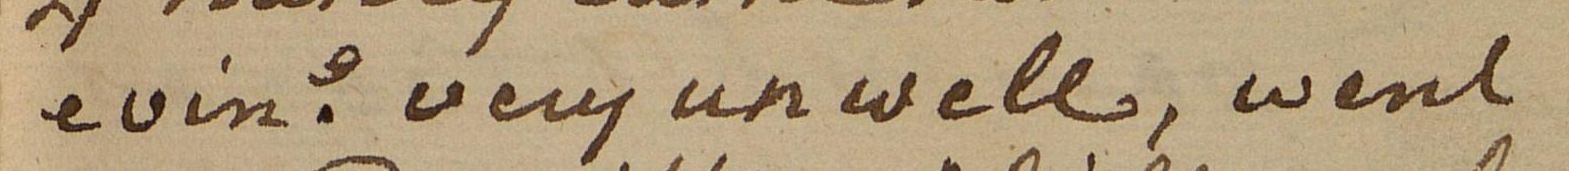even^g. very unwell, went
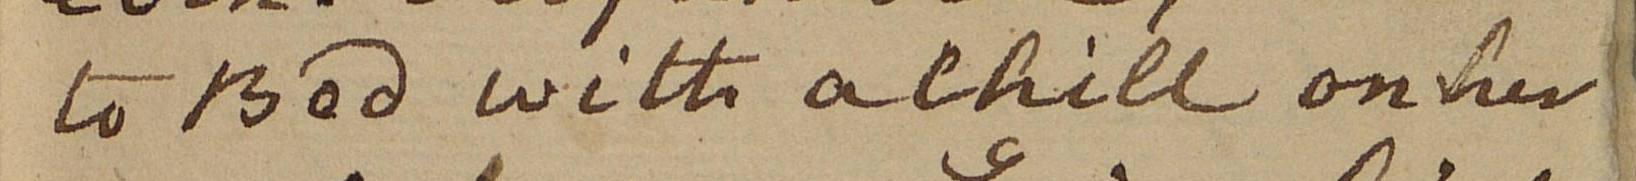to Bed with a chill on her
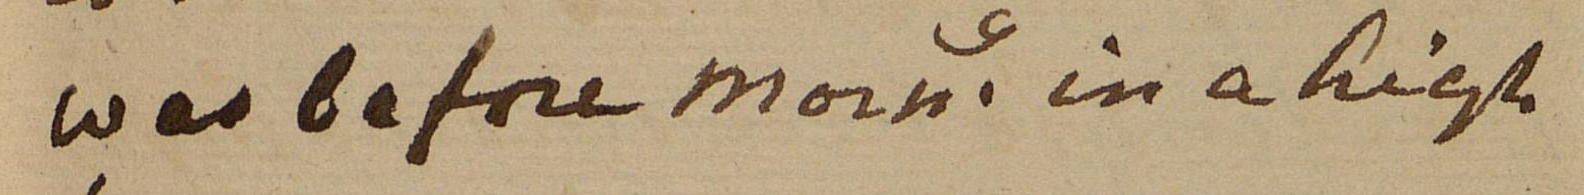was before morn^g. in a high
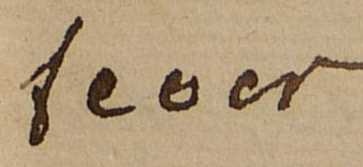fever-
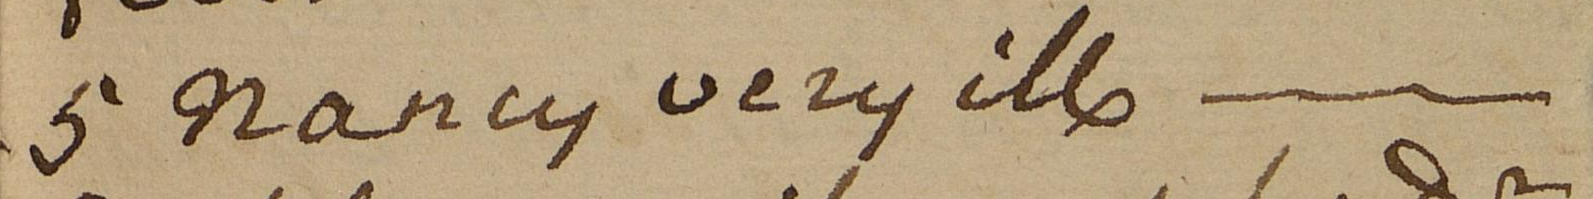5 Nancy very ill-
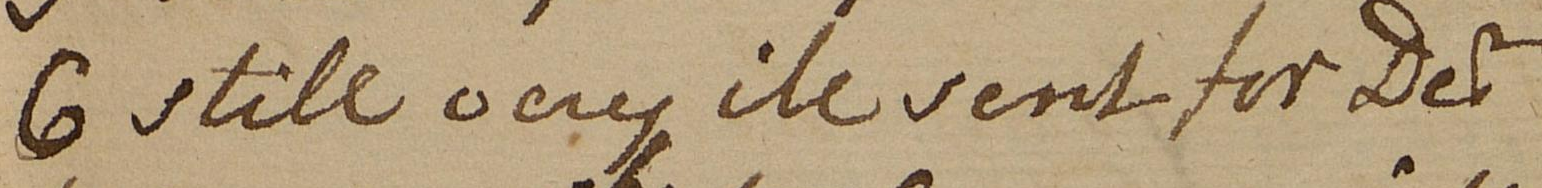6 still very ill sent for Deb^h
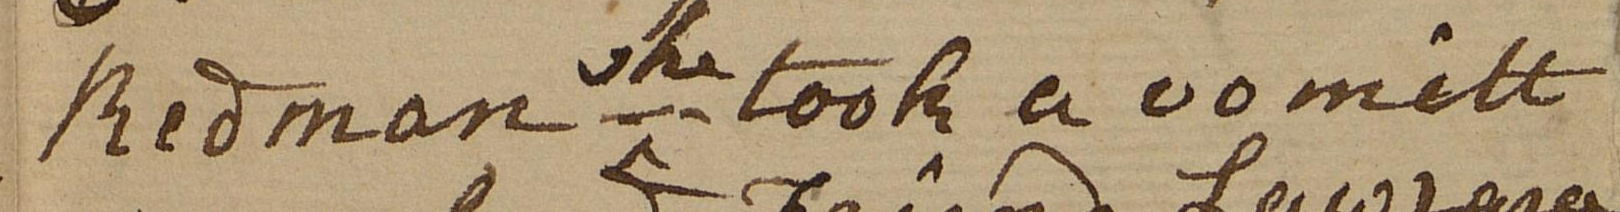Redman ^she - took a vomitt
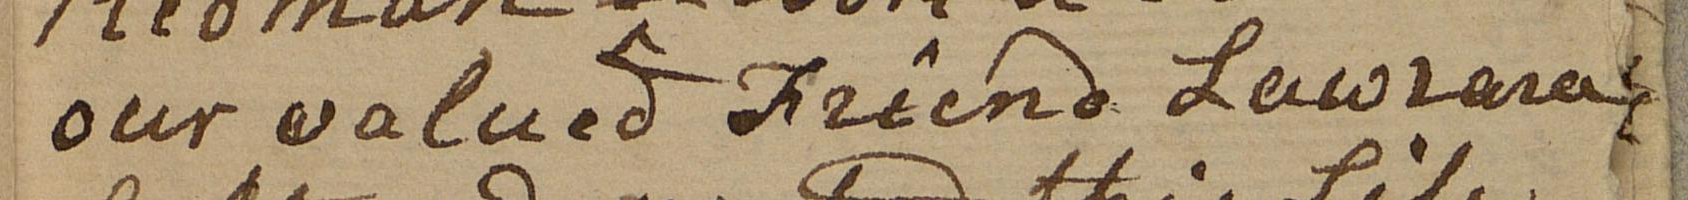ocir valued Friend Lawrance
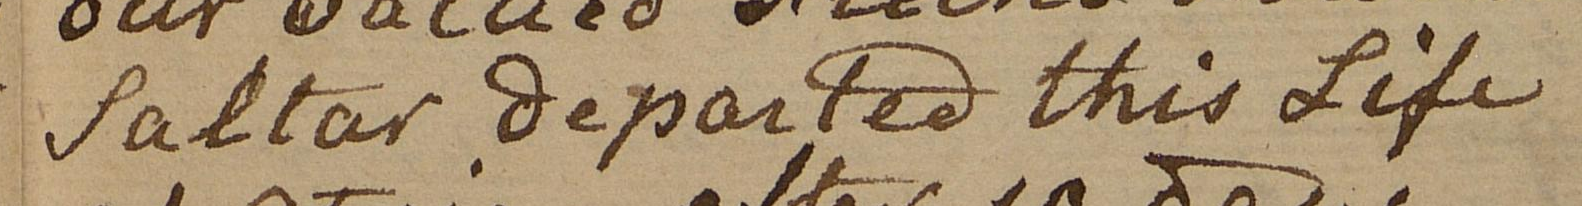Saltar departed this Life
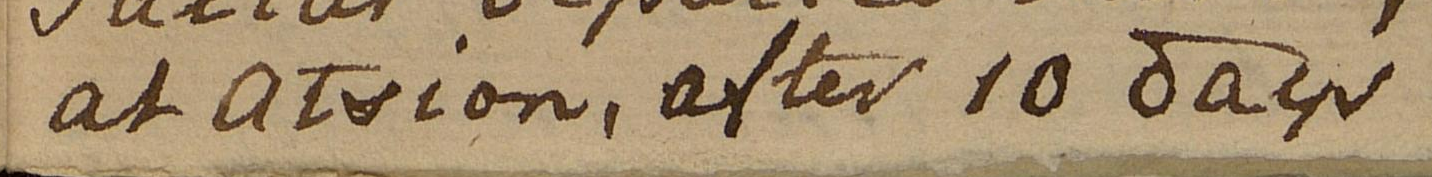at Atsion, after 10 days
